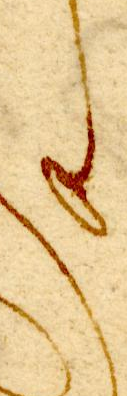To
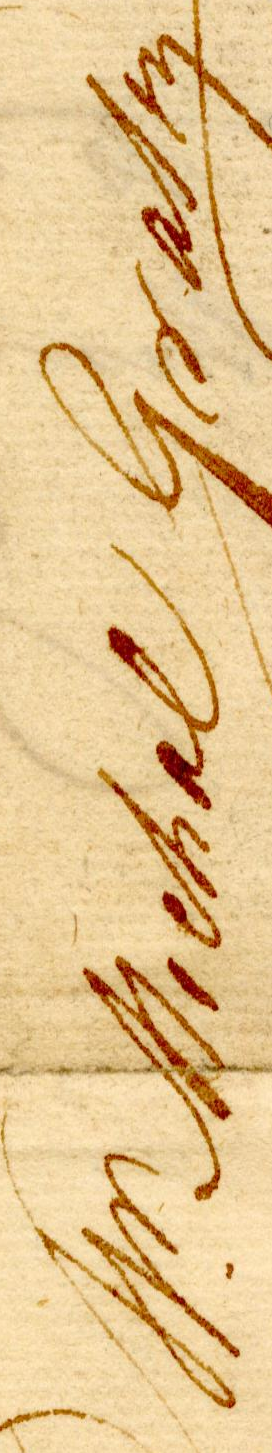M^r. Michal Gratz
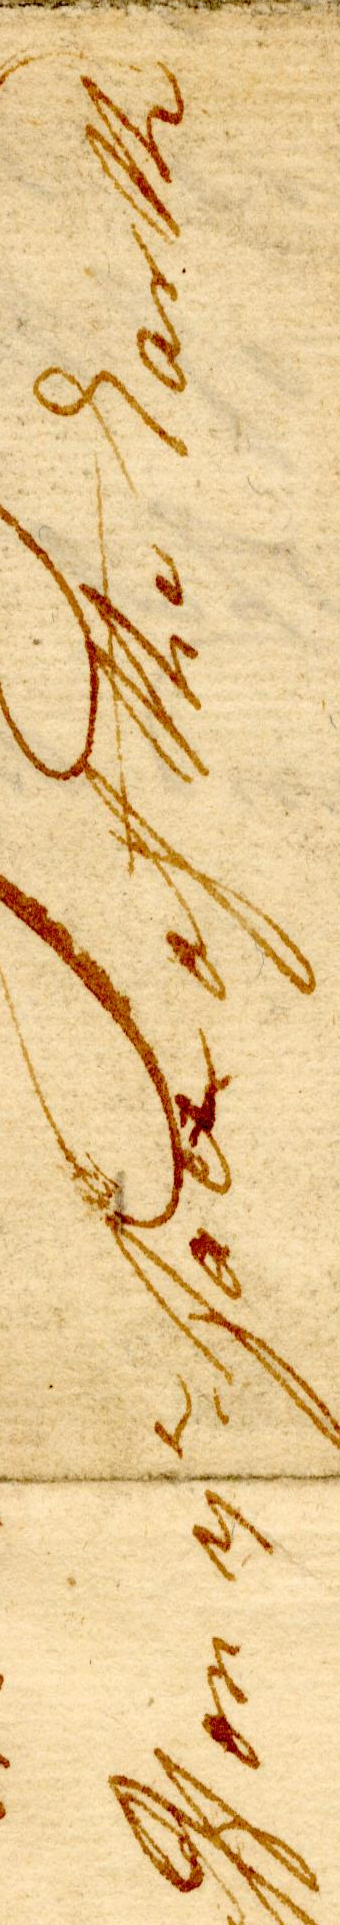If on y^e. face of the Earth
